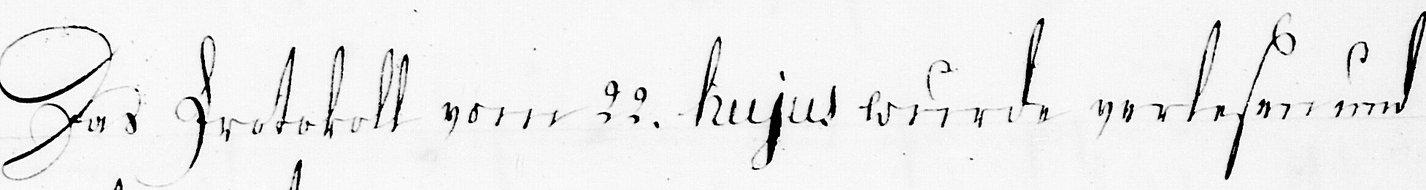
Das Protokoll vom 22. hujus wurde verlesen und
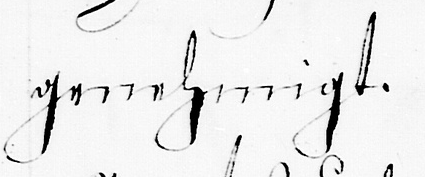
genehmigt.
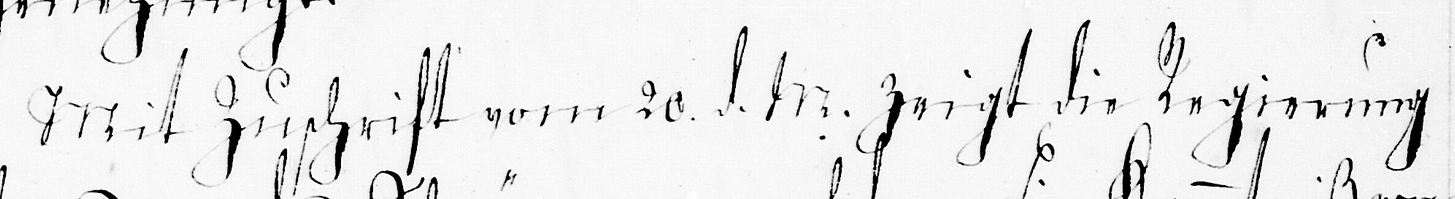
Mit Zuschrift vom 20. d. M. zeigt die Regierung
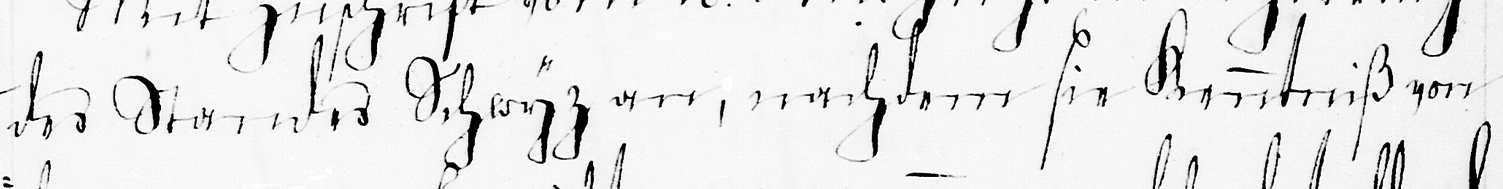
des Standes Schwyz an, nachdem sie Kenntniß von
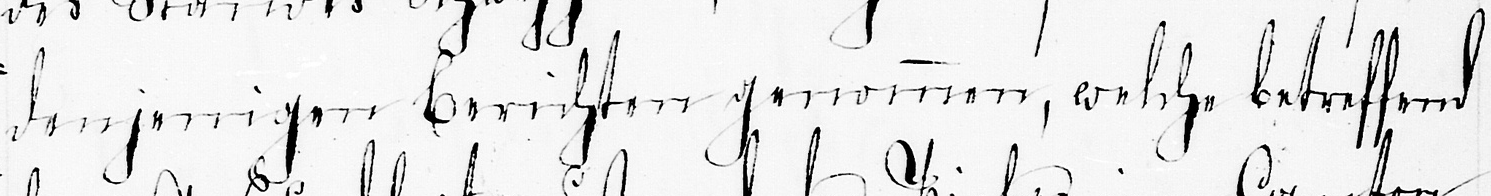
denjenigen Berichten genommen, welche betreffend
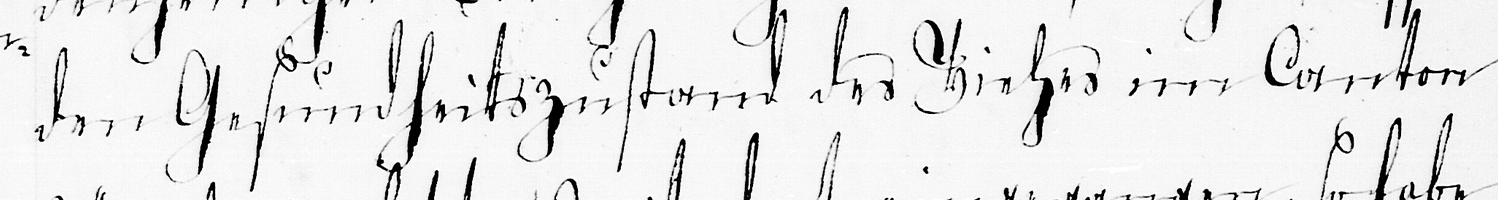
den Gesundheitszustand des Viehes im Canton
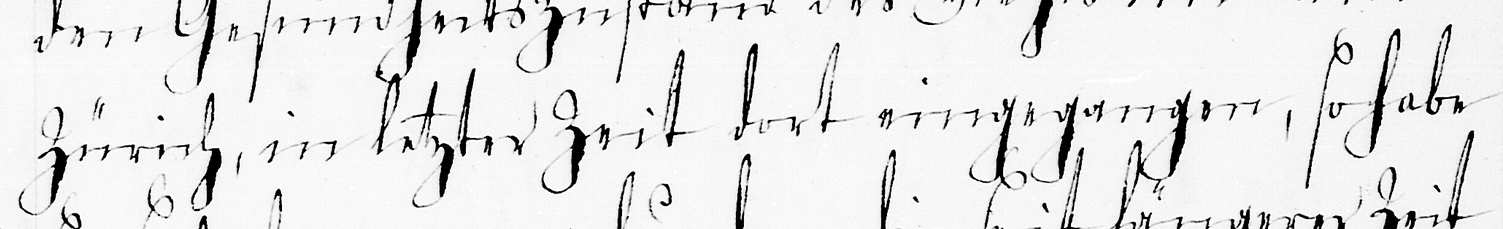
Zürich, in letzter Zeit dort eingegangen, so habe
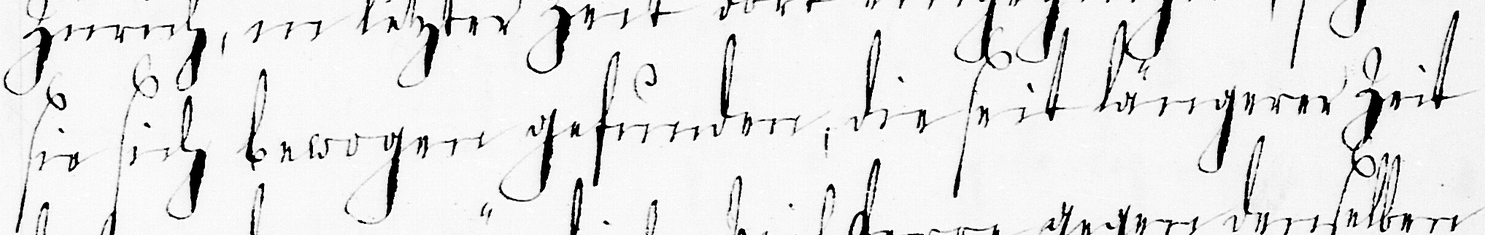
sie sich bewogen gefunden, die seit längerer Zeit
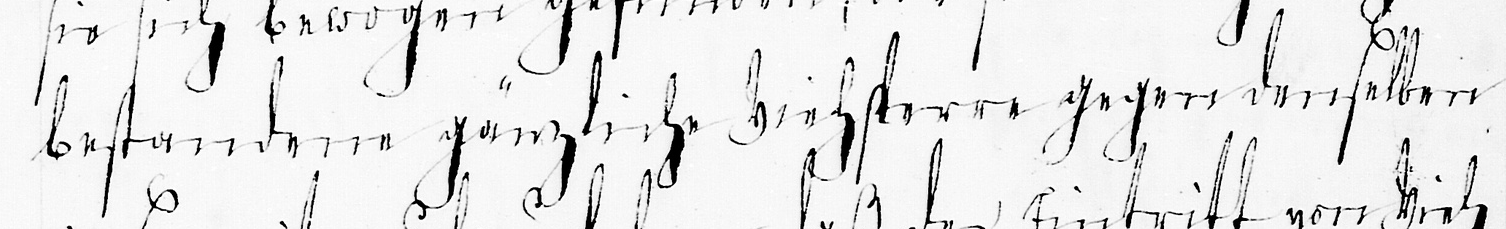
bestandene gänzliche Viehsperre gegen denselben
